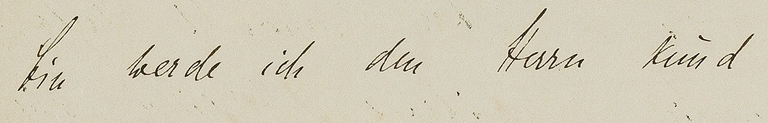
bin werde ich den Herrn kund
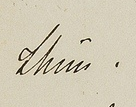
thun.
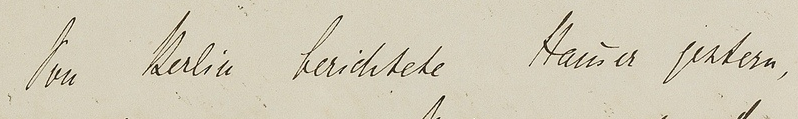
Von Berlin berichtete Hammergestern,
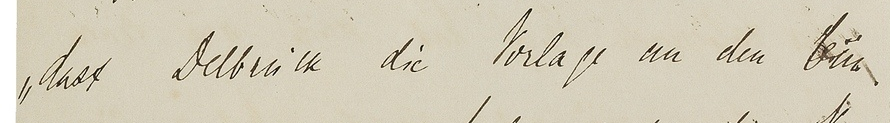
«dass Delbrück die Vorlage an den Bun-
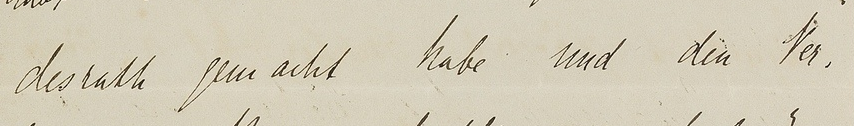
desrath gemacht habe und den Ver-
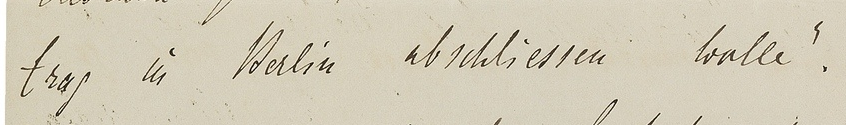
trag in Berlin abschliessen wolle».
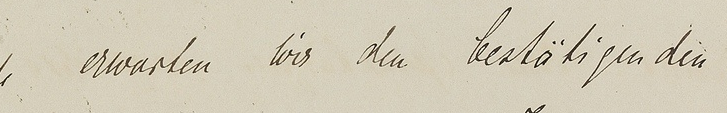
erwarten wir den bestätigenden
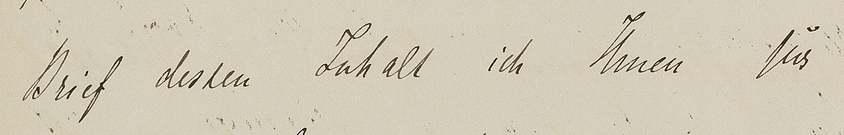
Brief dessen Inhalt ich Ihnen zur
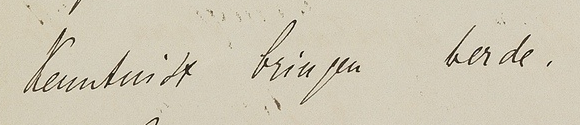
Kenntniss bringen werde.
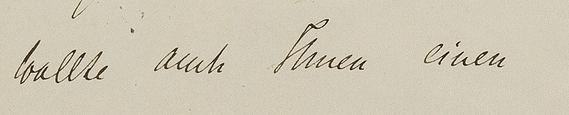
wollte auch Ihnen einen
